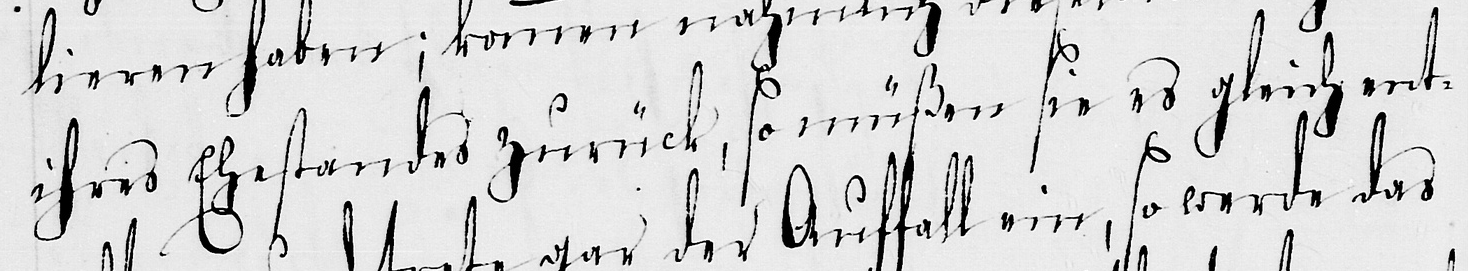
ihres Ehestandes zurück, so müßen sie es gleich ent¬
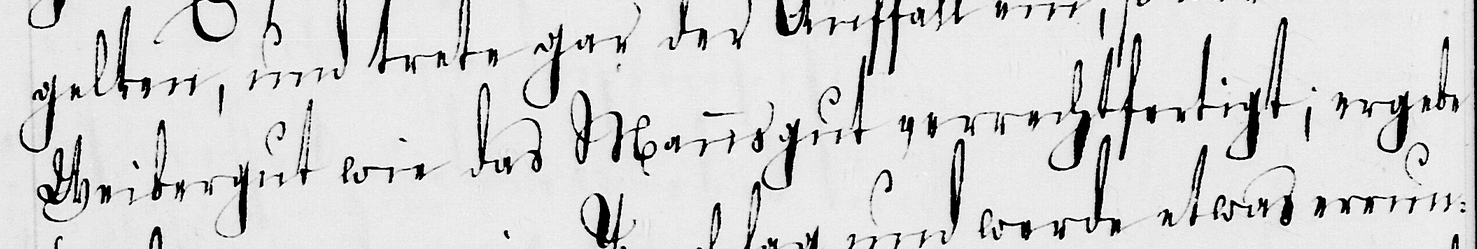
Weibergut wie das Mannsgut verrechtfertigt; ergebe
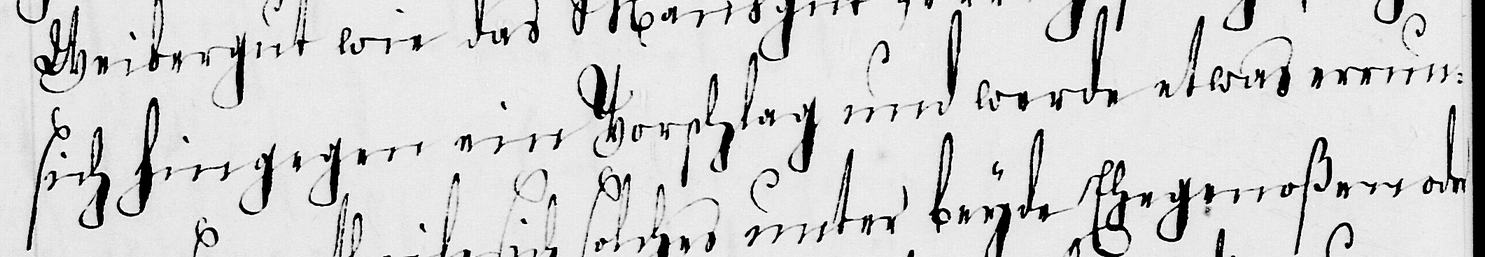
sich hingegen ein Vorschlag und werde etwas errun¬
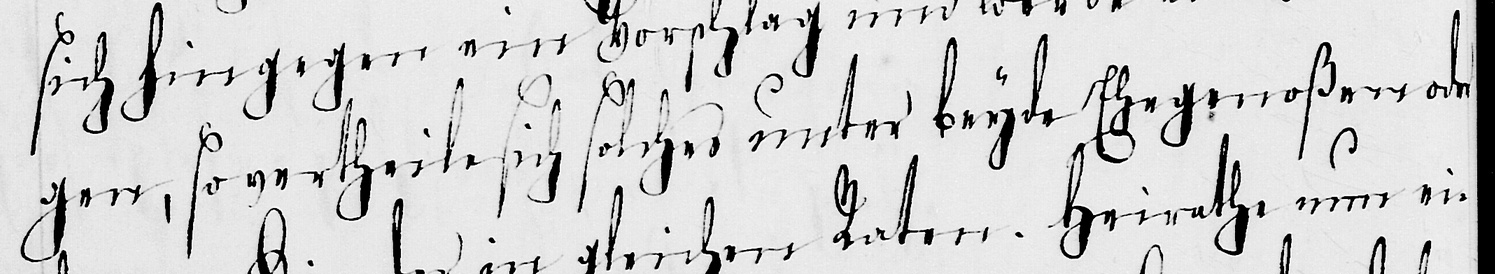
gen, so vertheile sich solches unter beyde Ehegenoßen oder
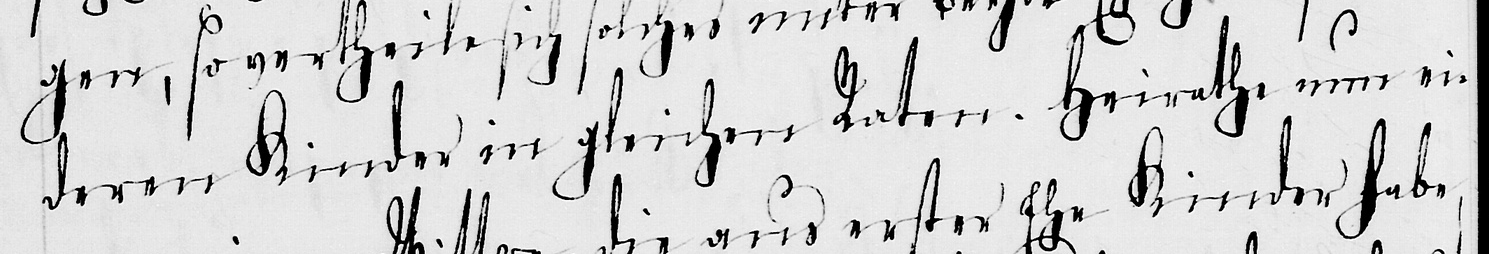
deren Kinder in gleichen Raten. Heirathe nun ei¬
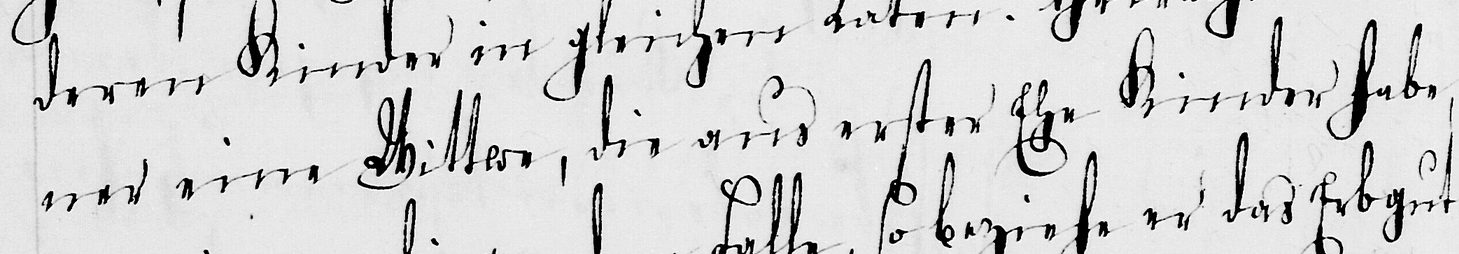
ner eine Wittwe, die aus erster Ehe Kinder habe,
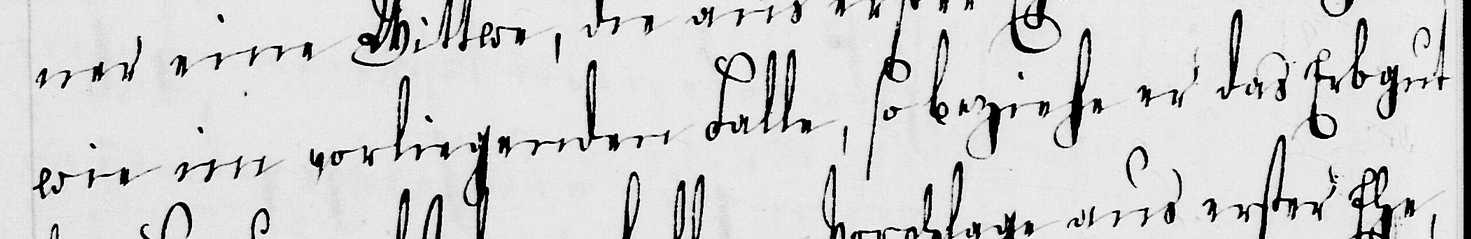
wie im vorliegenden Falle, so beziehe er das Erbgut
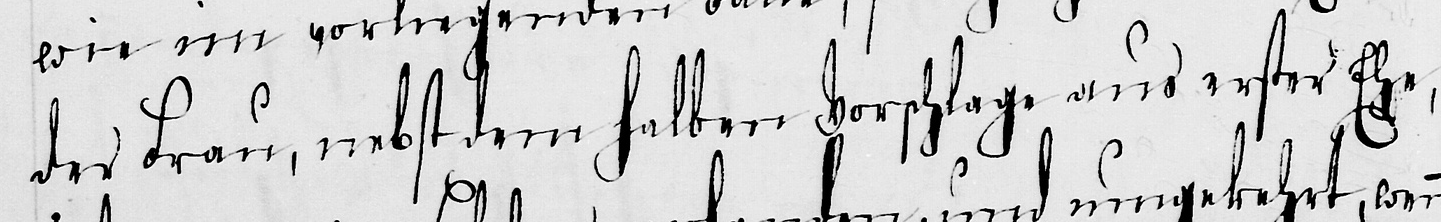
der Frau, nebst dem halben Vorschlage aus erster Ehe,
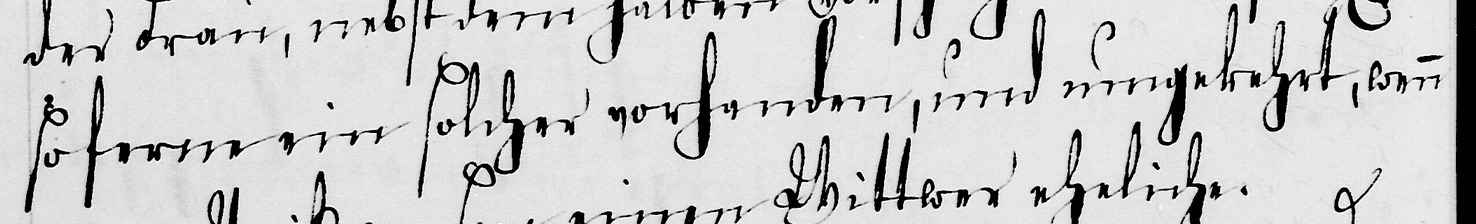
soferne ein solcher vorhanden, und umgekehrt, wenn
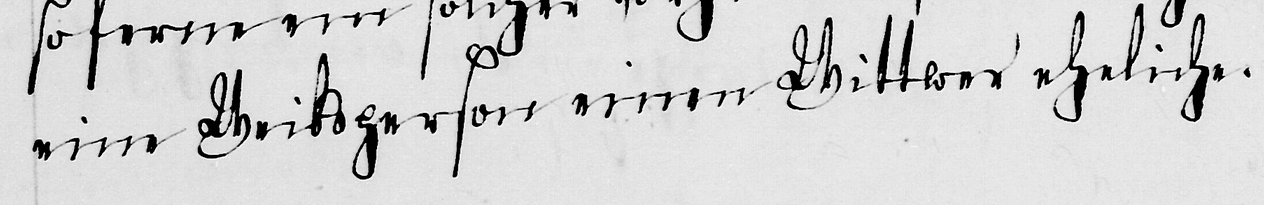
eine Weibsperson einen Wittwer eheliche.
